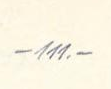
111
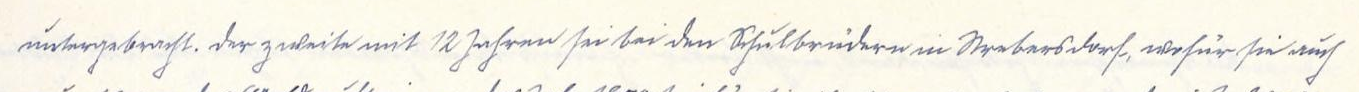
untergebracht. Der zweiten mit 12 Jahren sein bei den Schulbrüdern in Strebersdorf, wofür sie auch
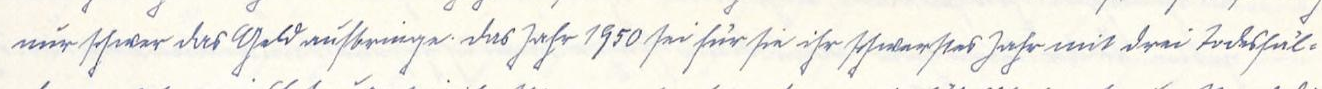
nur schwer das Geld aufbringe. Das Jahr 1950 sei für sie ihr schwerstes Jahr mit drei Todesfäl-
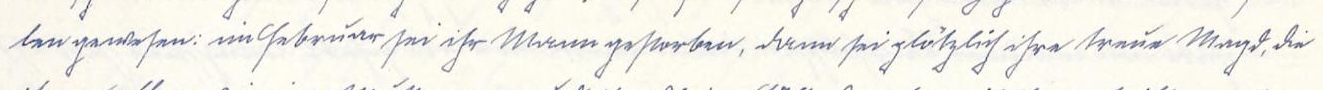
len gewesen: im Februar sei ihr Mann gestorben, dann sei plötzlich ihre treue Magd, die
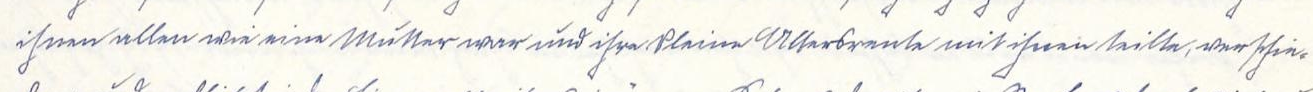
ihnen allen wie eine Mutter war und ihre kleine Altersrente mit ihnen teilte, verschie-
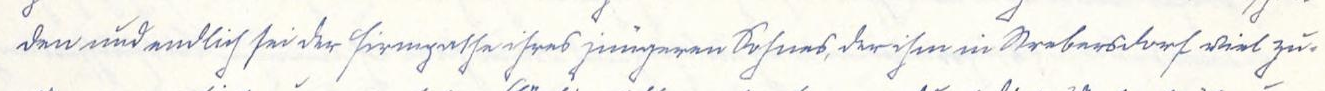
den und endlich sei der Firmpathe ihres jüngeren Sohnes, der ihm in Strebersdorf viel zu-
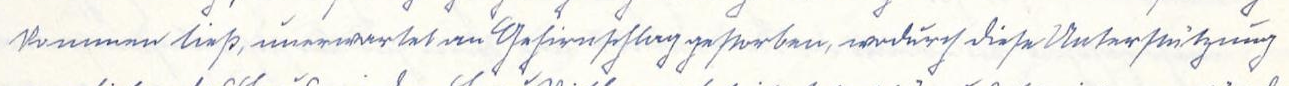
kommen ließ, unerwartet an Gehirnschlag gestorben, wodurch diese Unterstützung
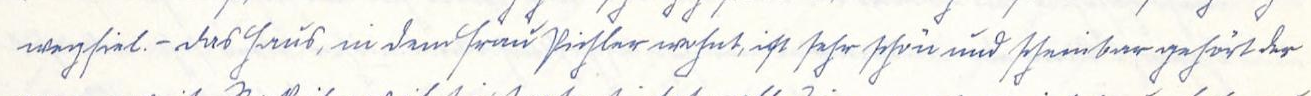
wegfiel.- Das Haus, in dem Frau Pichler wohnte, ist sehr schön und scheinbar gehört der
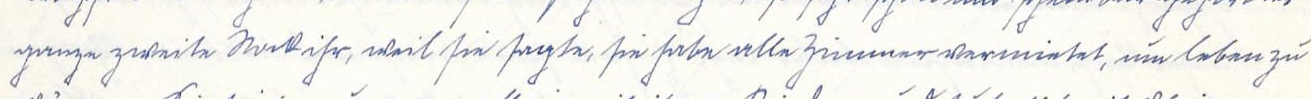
ganze zweite Stock ihr, weil sie sagte, sie habe alle Zimmer vermietet, um leben zu
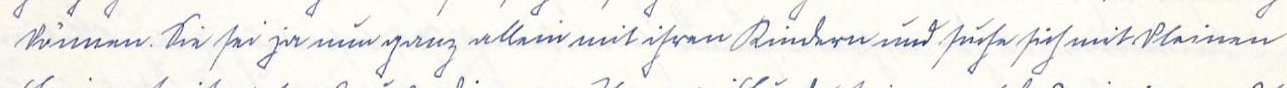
können. Sie sei ja nun ganz allem mit ihren Kindern und suche sich mit kleinen
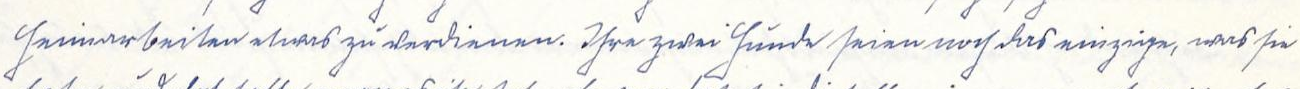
heimarbeiten etwas zu verdienen. Ihre zwei Hunder seien noch das einzige, was sie
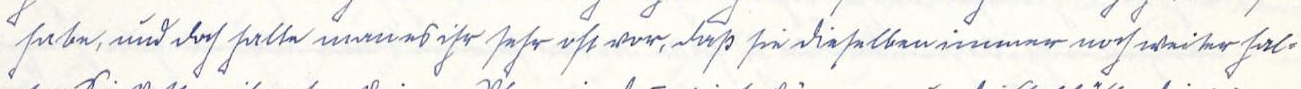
habe, und doch halte man es ihr sehr oft vor, dass sie dieselben immer noch weiter hal-
